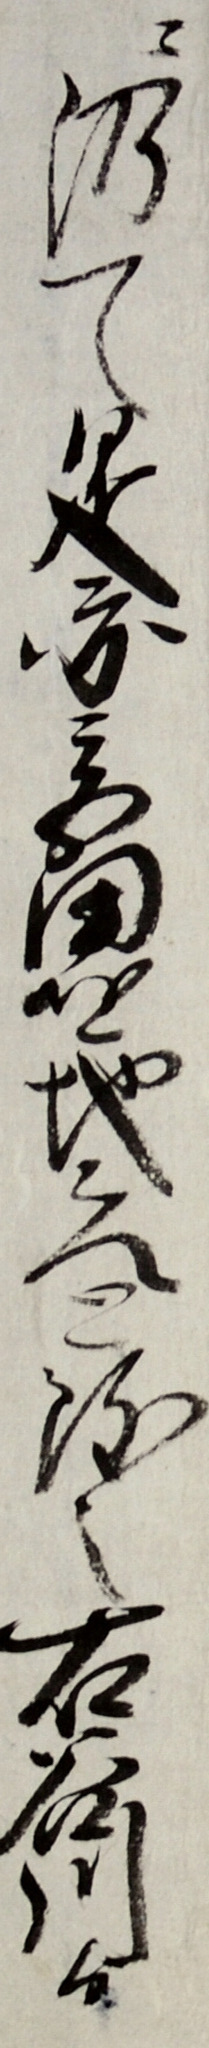ニ仍て是亦宮田を地元と致し右谷川ゟ
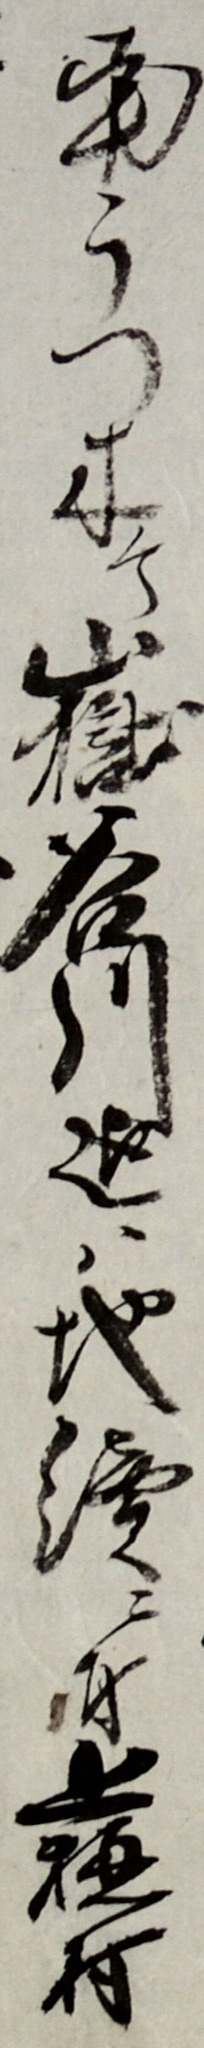南うつ木ヶ嶽谷川迄ㇵ地續ニ付上穂村
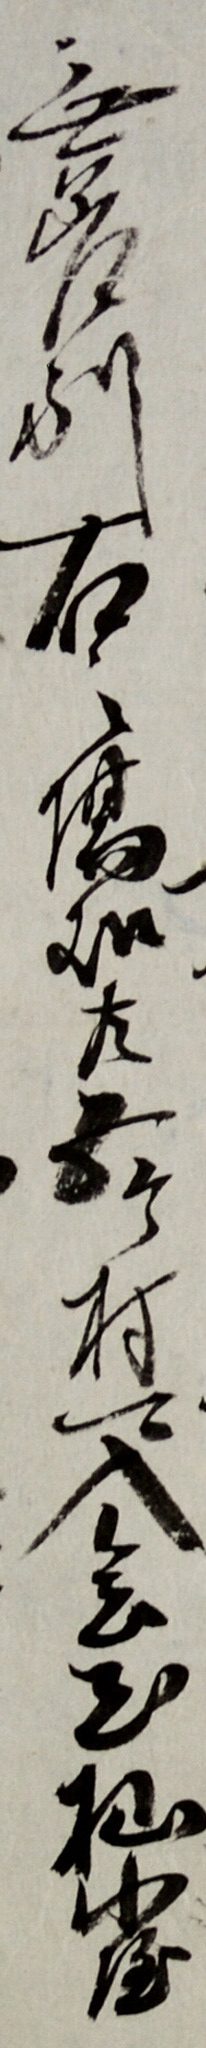無差別右之場処共五ヶ村可入会尤杣小屋
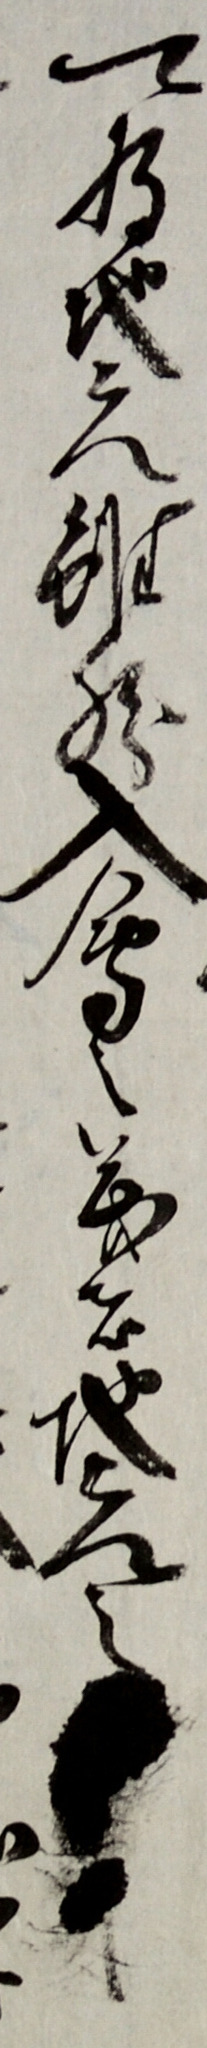可為地元雖然入会之義者地元之
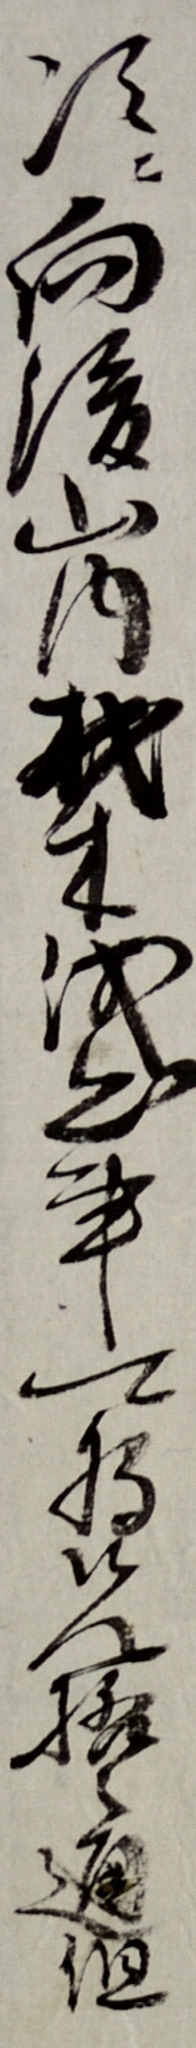次ニ向後山内材木伐出事可為先格之通但
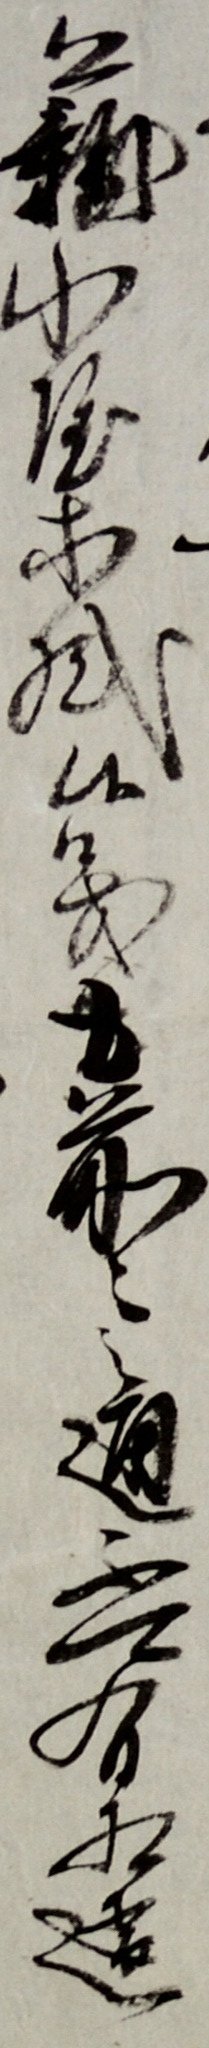薪小屋等掛候義者前々之通不可有相違
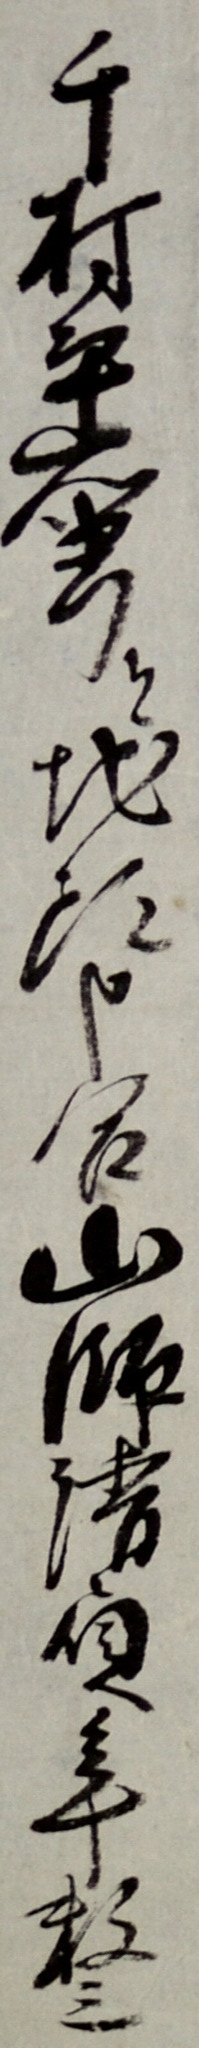千村平右衛門と地頭申合山師請負年数三
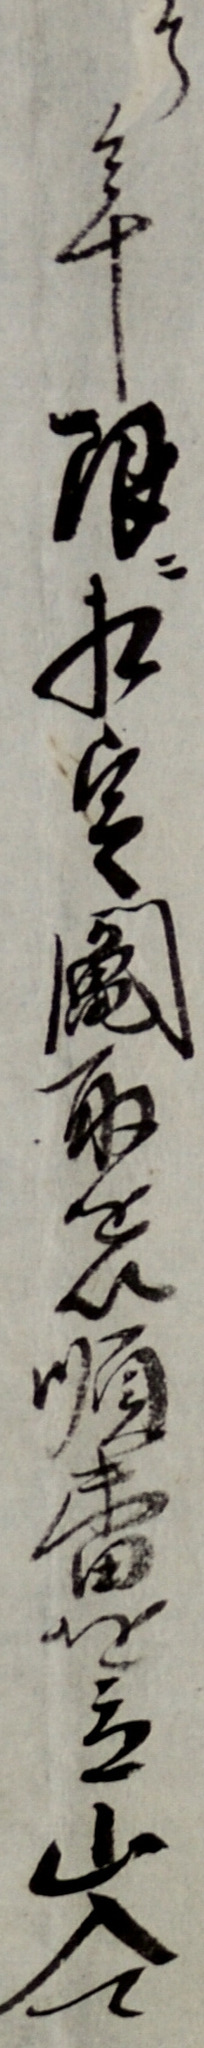ケ年限ニ相定鬮取を以順番を立山入可

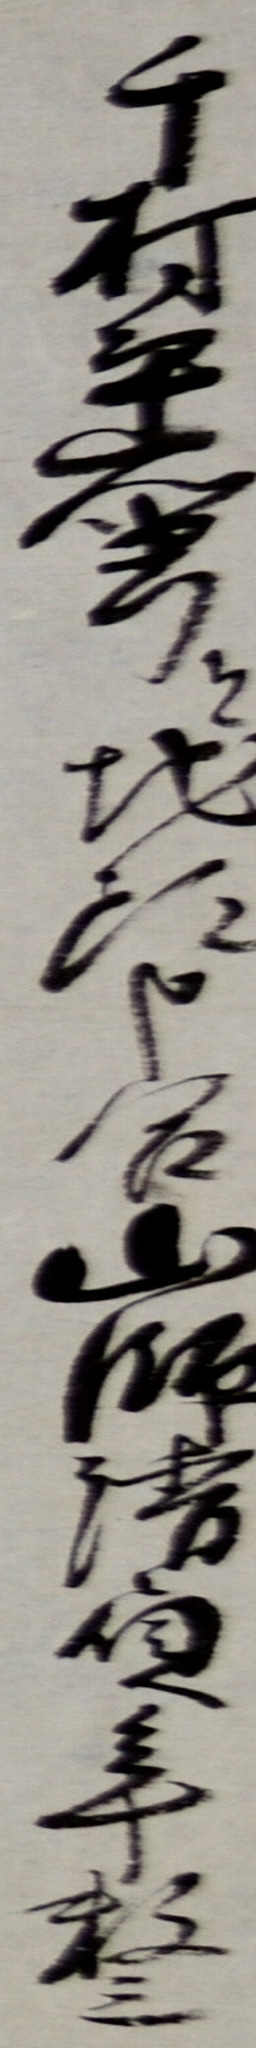千村平右衛門と地頭申合山師請負年数三
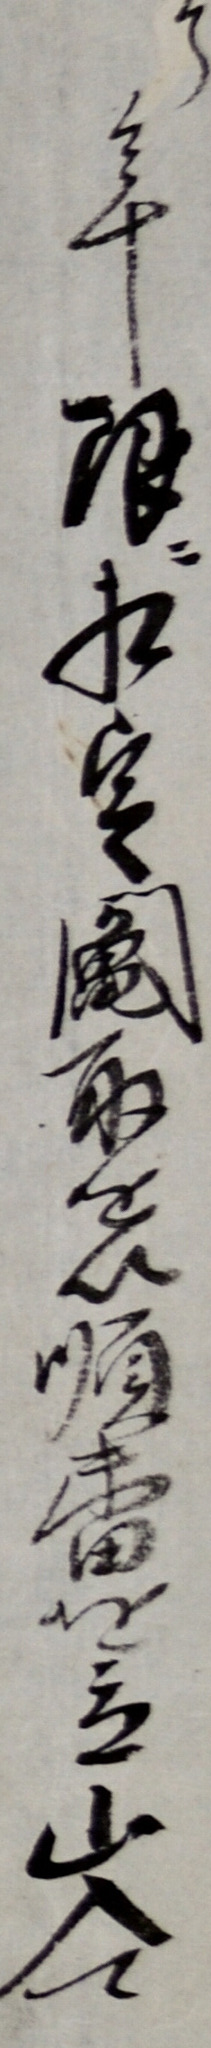ケ年限ニ相定鬮取を以順番を立山入可
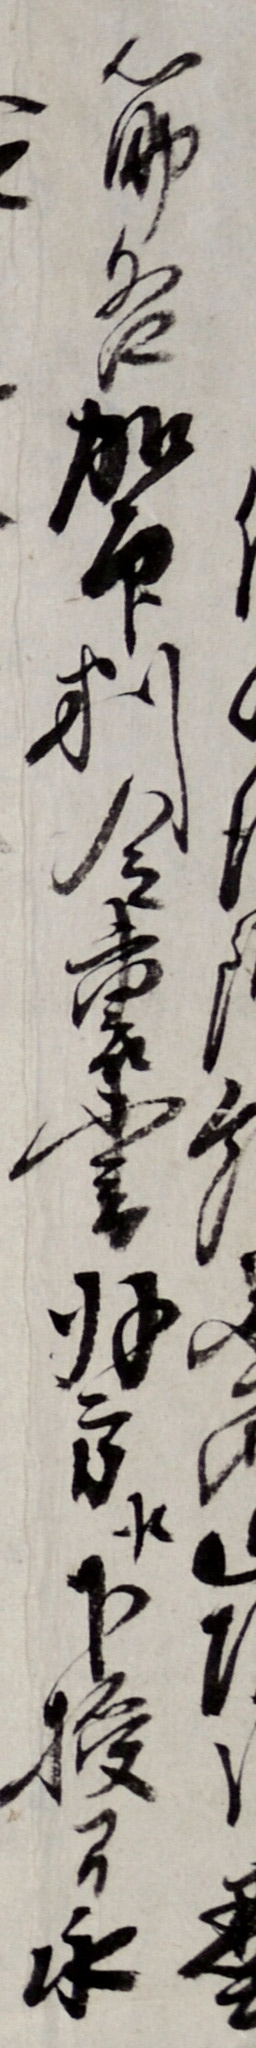筋各加印判令裏書双方江下授間承
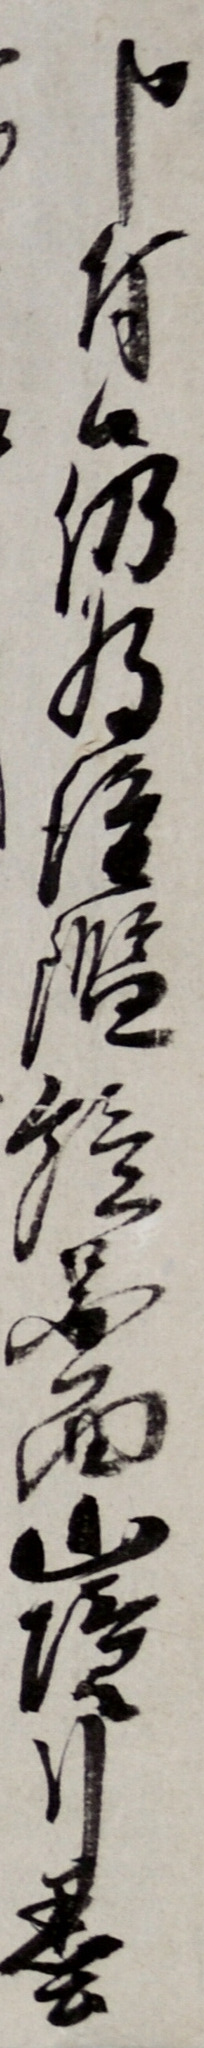申付候仍為後鑑絵図面山境引墨
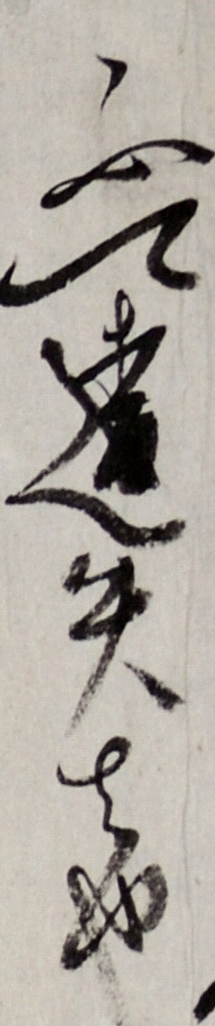不可違失者也
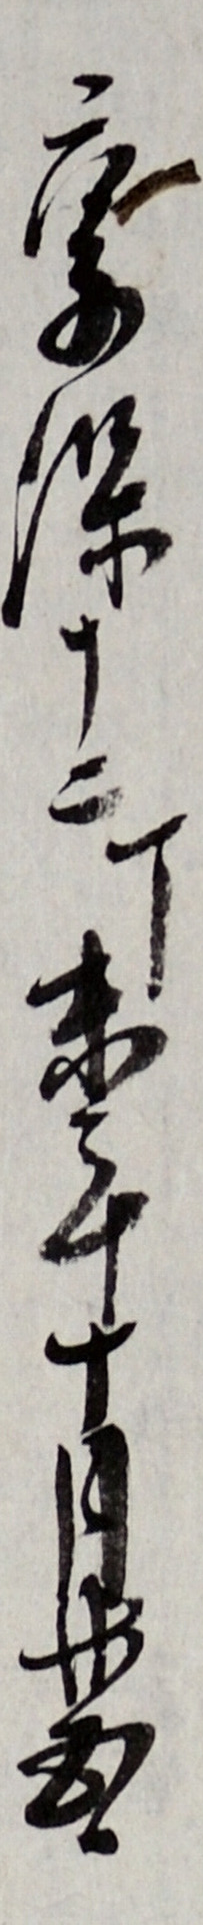享保十二年丁未年十月廿五日
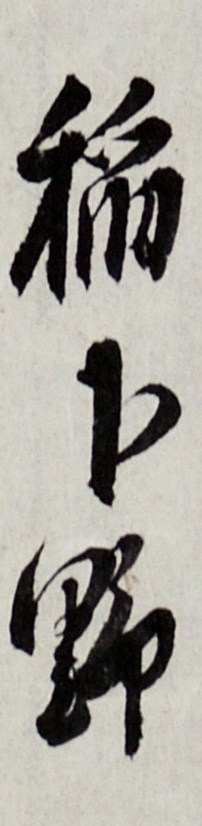稲下野
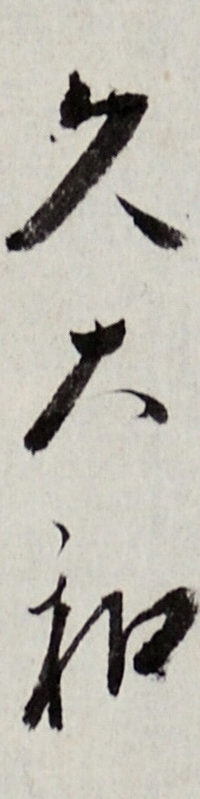久大和
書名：赤穂宮田山論裁許状
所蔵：伊那市立高遠町図書館・合同会社AMANE
